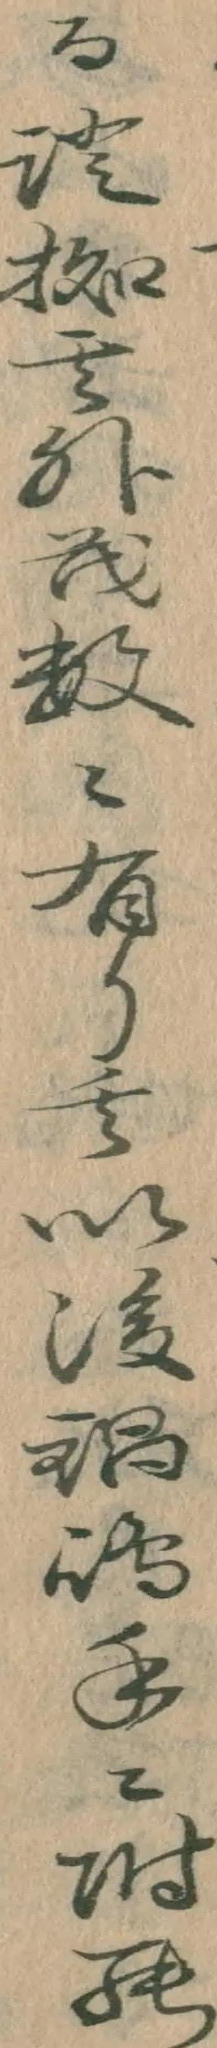る證拠其外茂数々有り其以後鍋島手に附罷
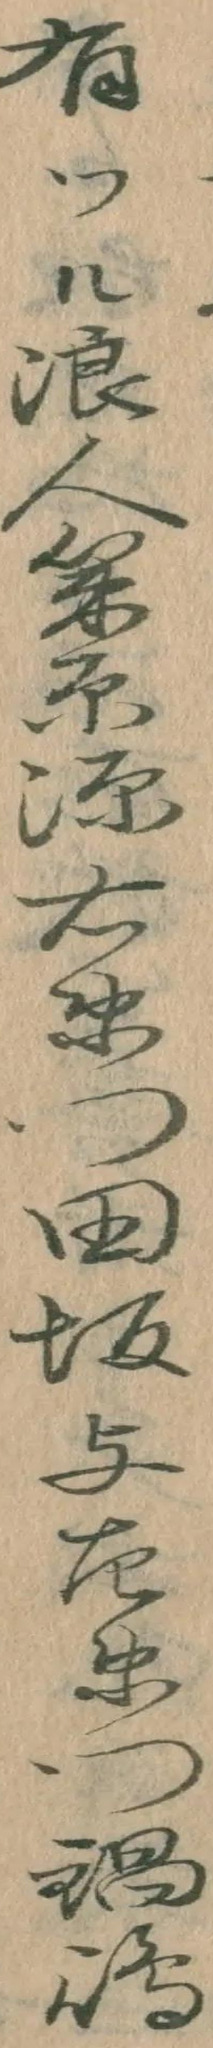有つ候浪人策原源右衛門田坂与左衛門鍋島
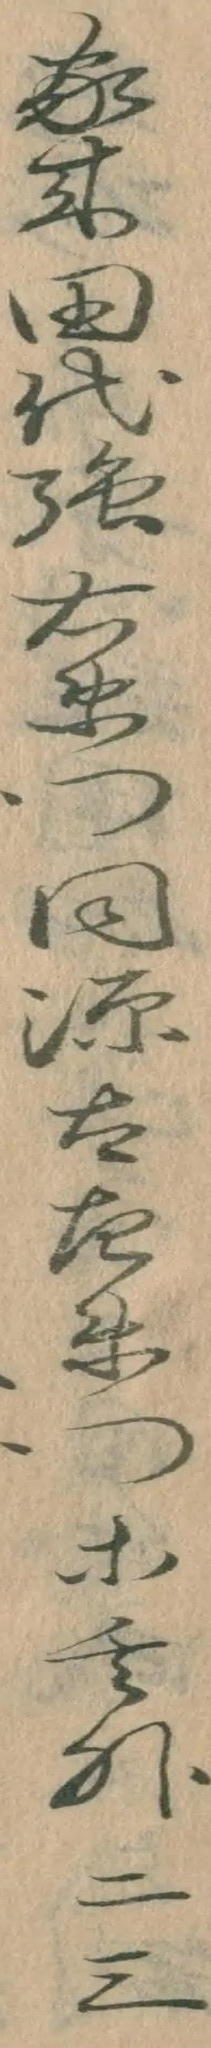家来田代強右衛門同源太左衛門等其外二三
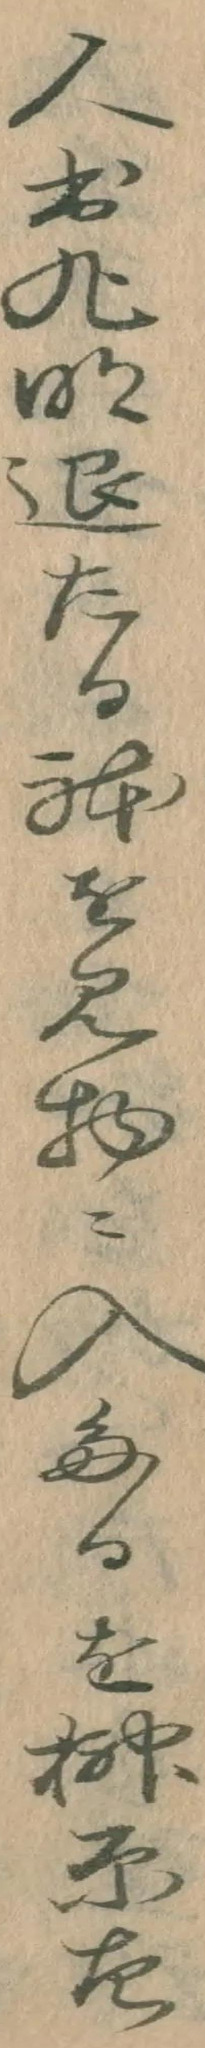人出丸明退たる躰を見物に入多るを榊原左
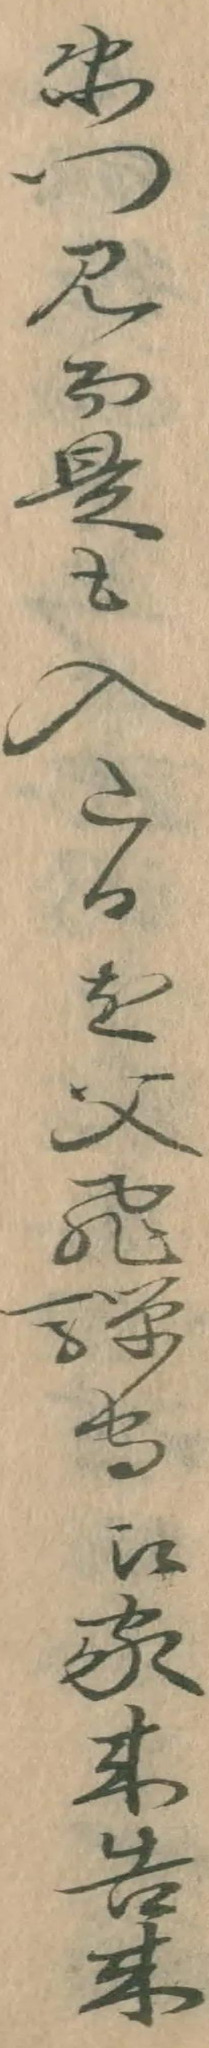衛門見而是も入たるを父飛騨守江家来告来

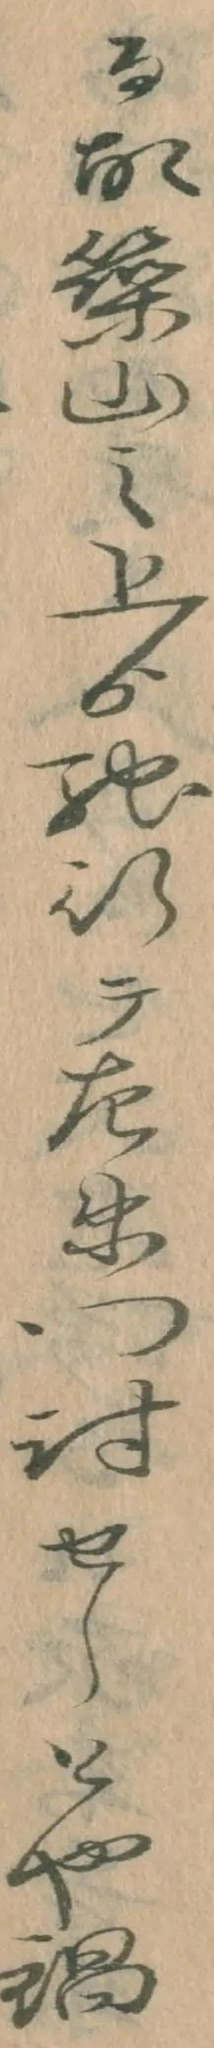る故築山之上ゟ馳行て左衛門討せしとや鍋
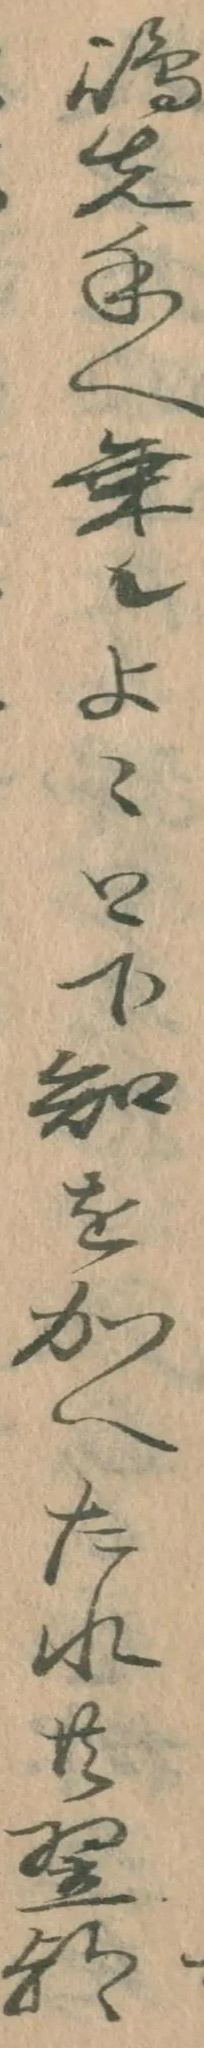島先手へ乗れよくと下知を加へたれ共翌朝
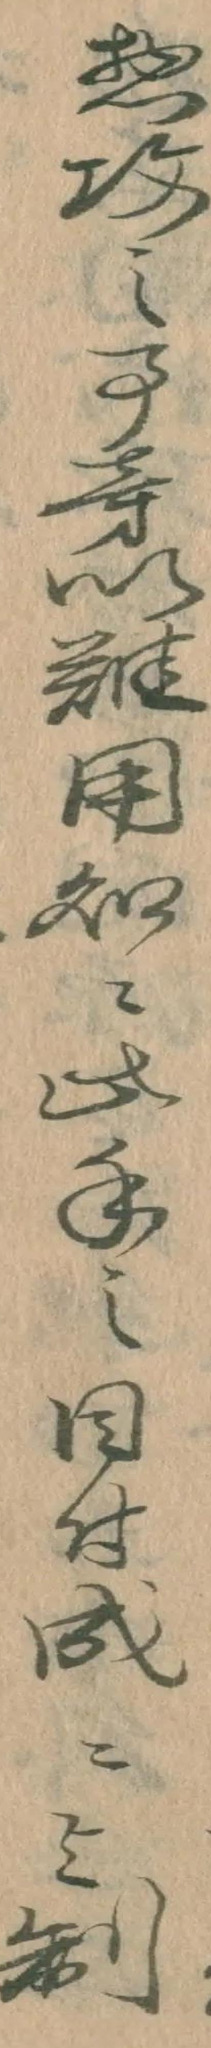惣攻之事旁以難用処に此手之目付成に与制
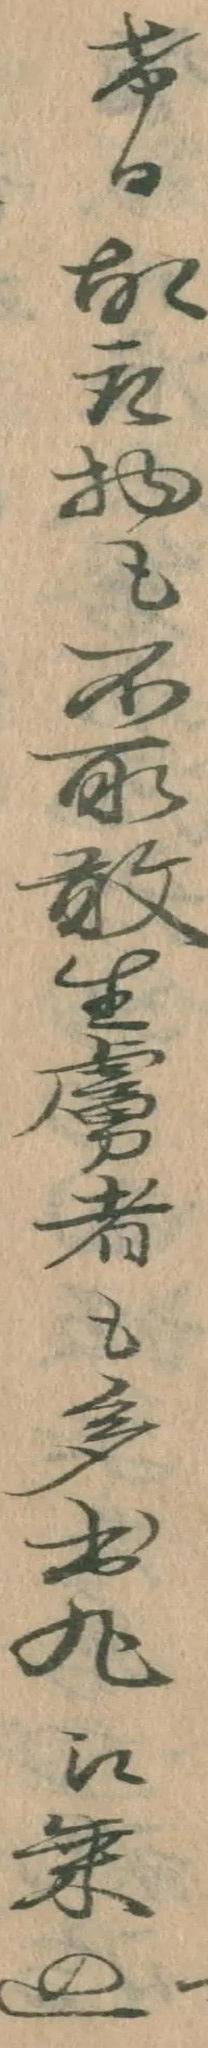希る故取物も不取敢生虜者も多出丸江乗込
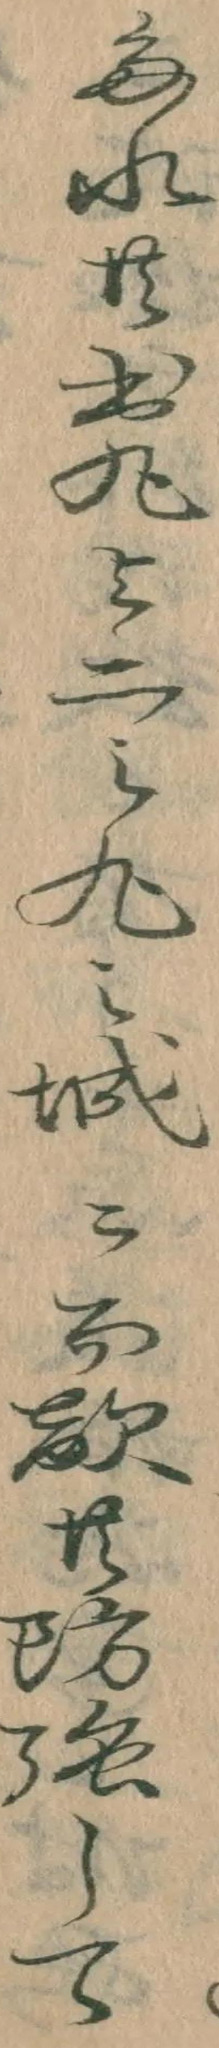多れ共出丸与二之丸之城に而敵共防強して
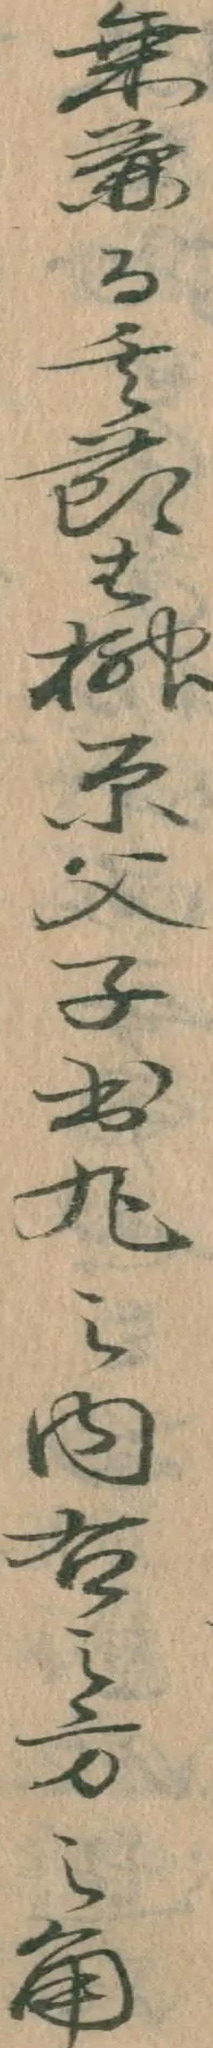乗兼る其節者榊原父子出丸之内右之方之角
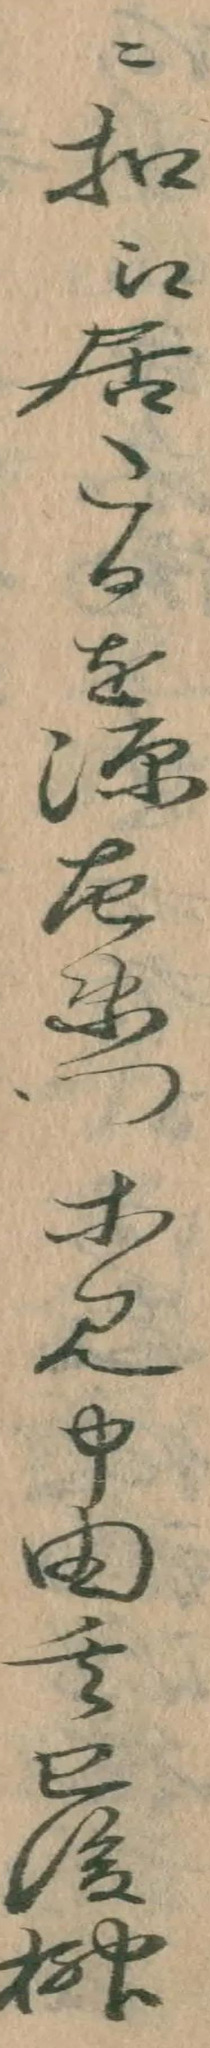に扣江居たるを源左衛門等見申由其巳後榊
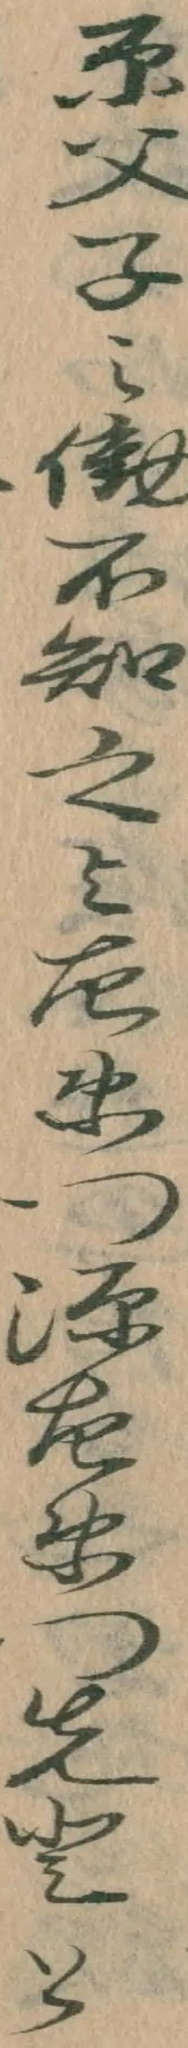原父子之働不知之与左衛門源左衛門先登と
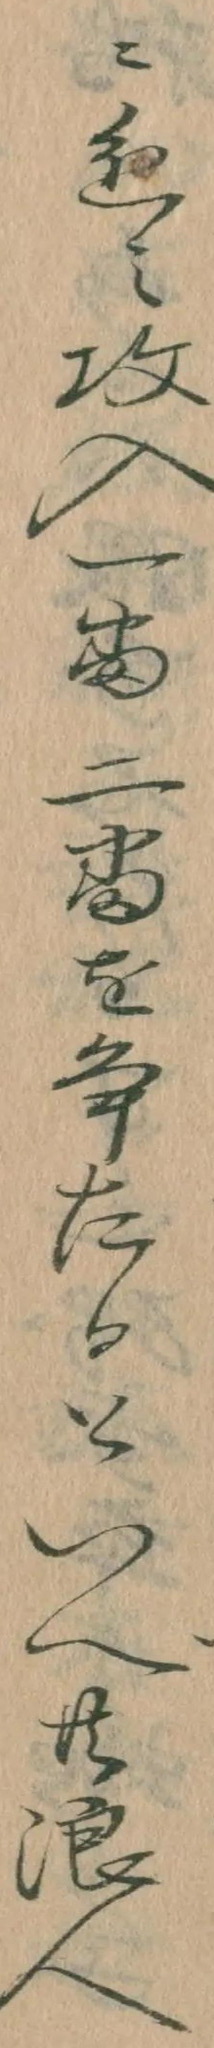に進之攻入一番二番を争たるといへ共浪人
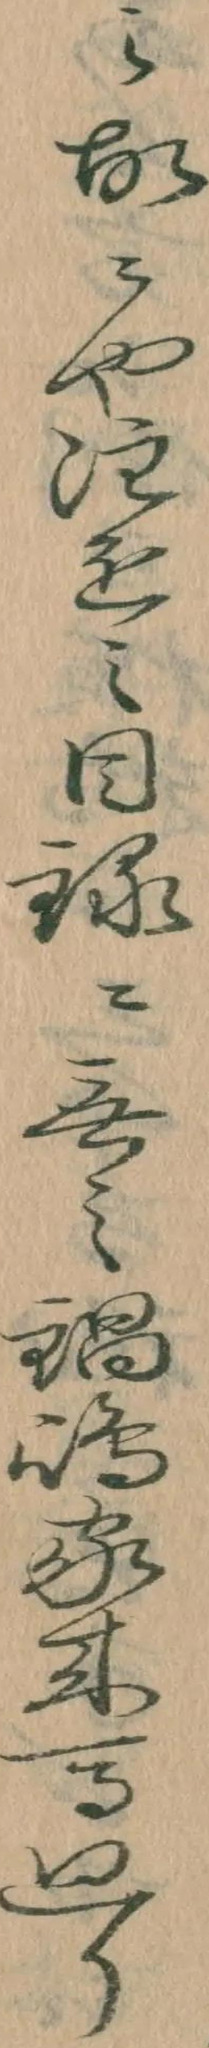之故にや注進之目録に無之鍋島家来馬廻り
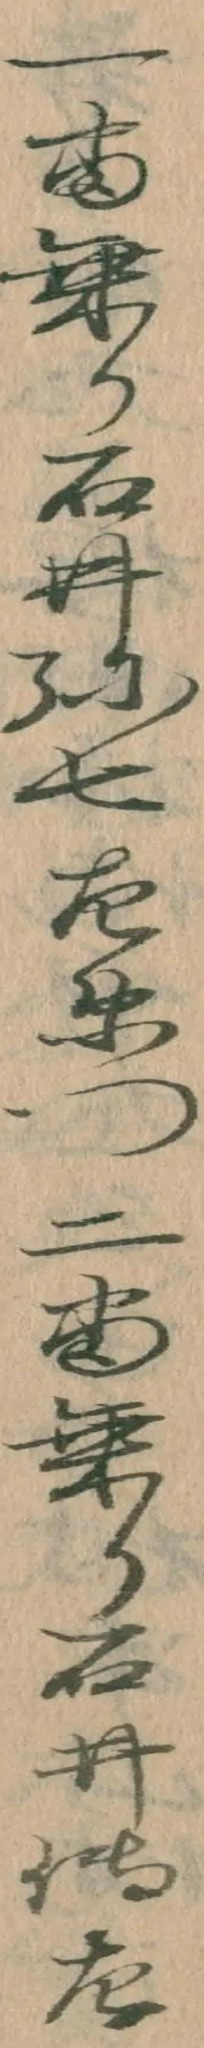一番乗り石井弥七左衛門二番乗り石井伝左
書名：切支丹御退治記 49巻. [7]
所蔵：国立国会図書館 National Diet Library, JAPAN
